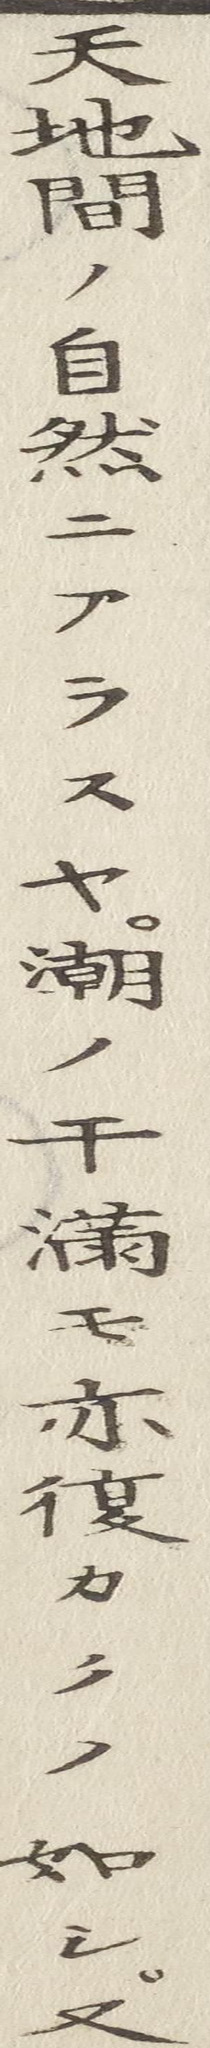天地間ノ自然ニアラスヤ。潮ノ干満モ亦復カクノ如シ。又
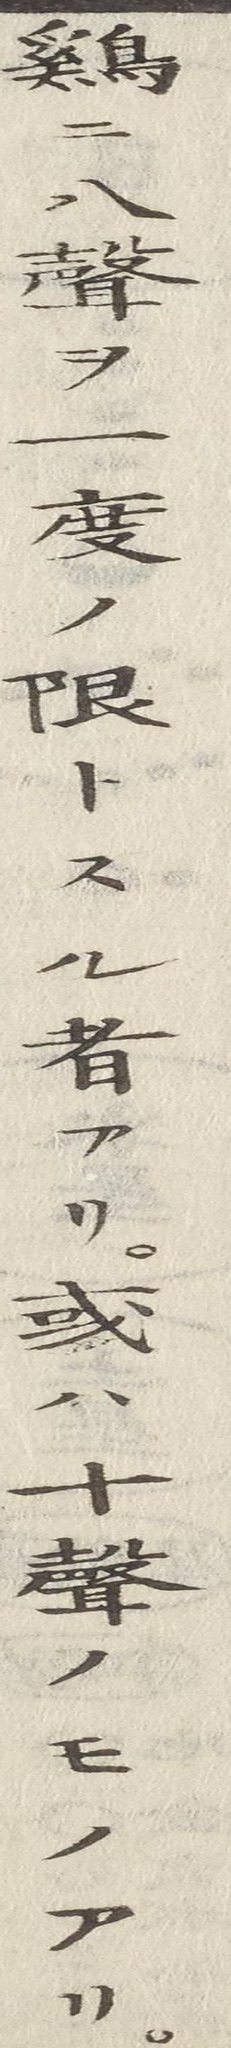鶏ニ八声ヲ一度ノ限トスル者アリ。或ハ十声ノモノアリ。
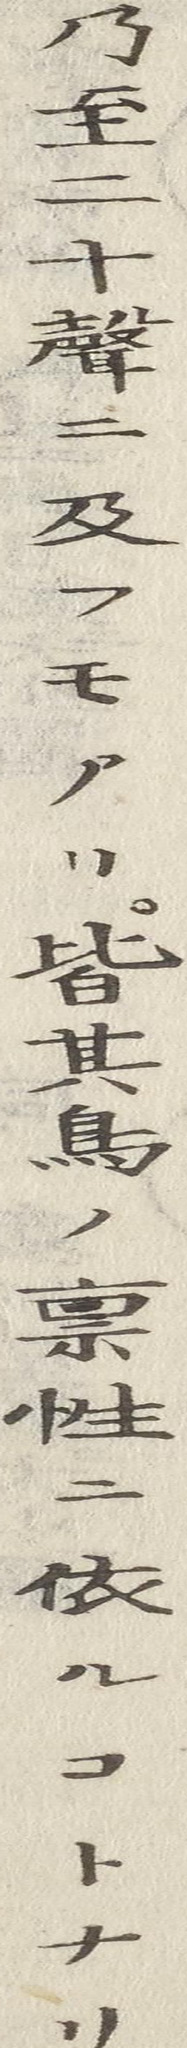乃至二十声ニ及フモアリ。皆其鳥ノ稟性ニ依ルコトナリ
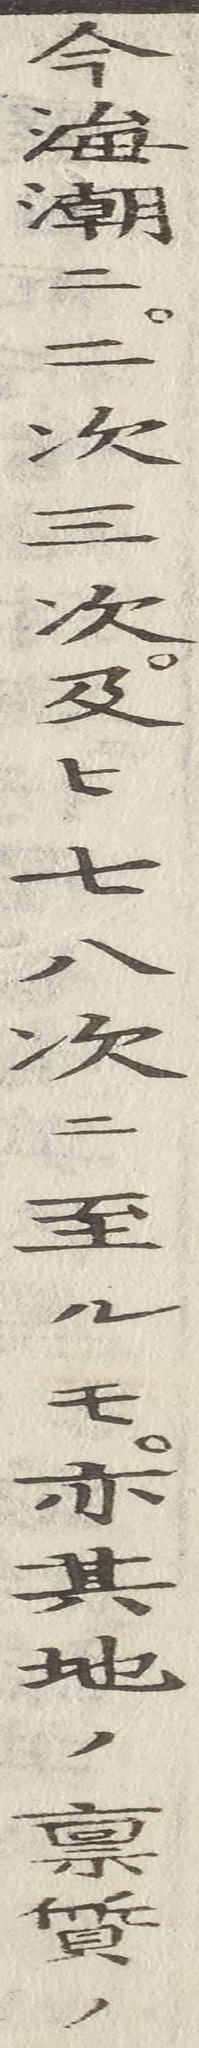今海潮ニ。二次三次。及ヒ七八次ニ至ルモ。亦其地ノ稟質ノ
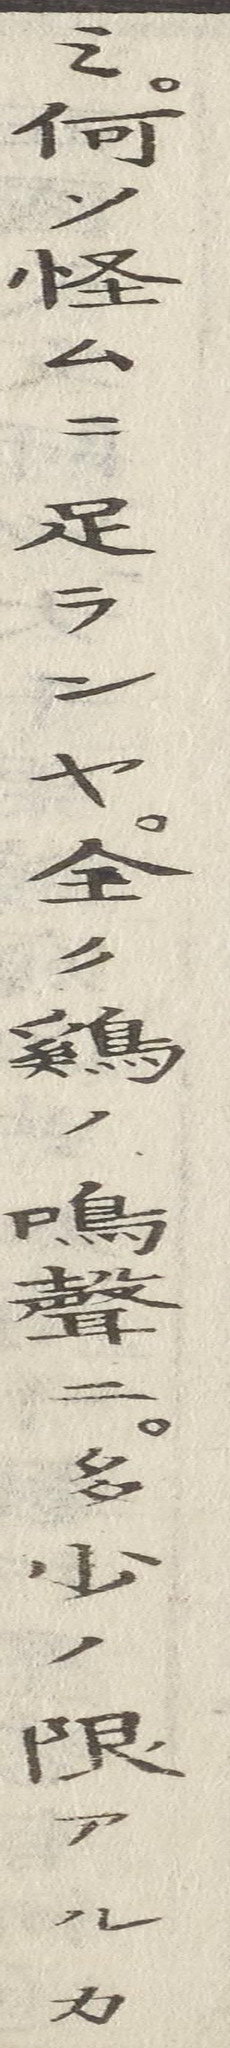ミ。何ソ怪ムニ足ランヤ。全ク鶏ノ鳴声ニ。多少ノ限アルカ
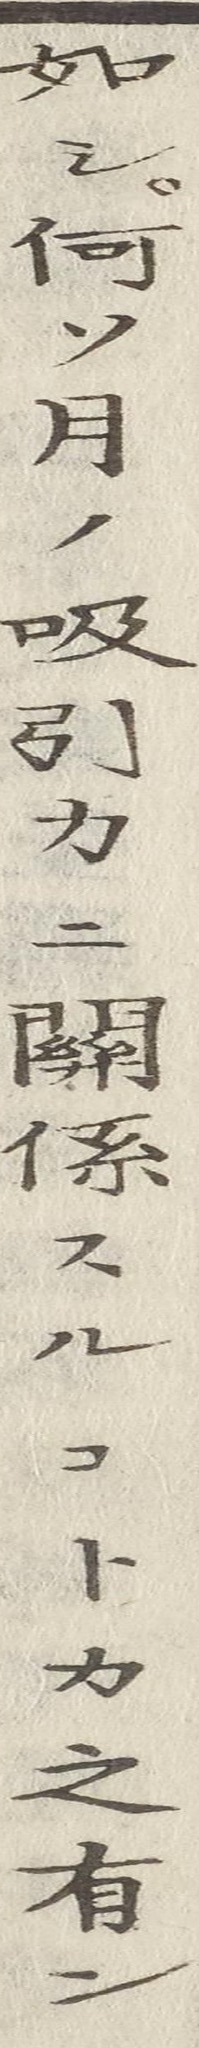如シ。何ソ月ノ吸引力ニ関係スルコトカ之有ン
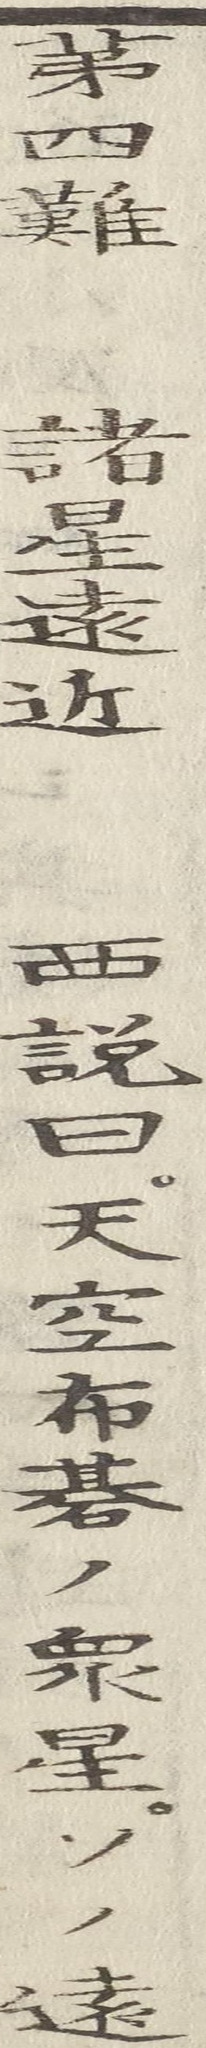第四難諸星遠近西説曰。天空布碁ノ衆星。ソノ遠

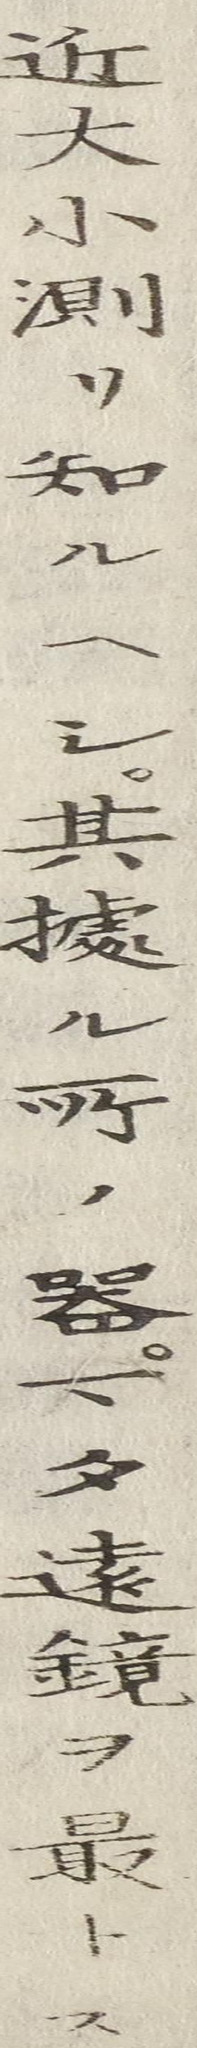近大小測リ知ルヘシ。其拠ル所ノ器。マタ遠鏡ヲ最トス
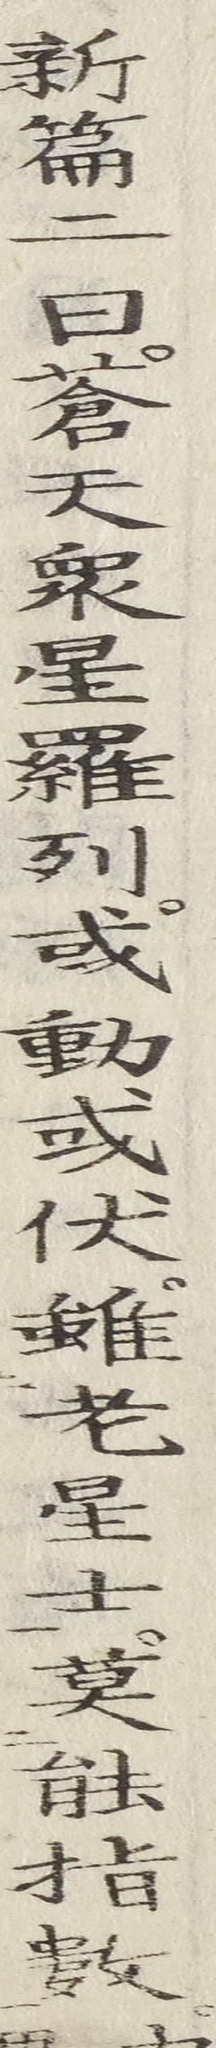新篇ニ曰。蒼天衆星羅列。或動或伏。雖ニ老星士。莫ニ能指数。中略
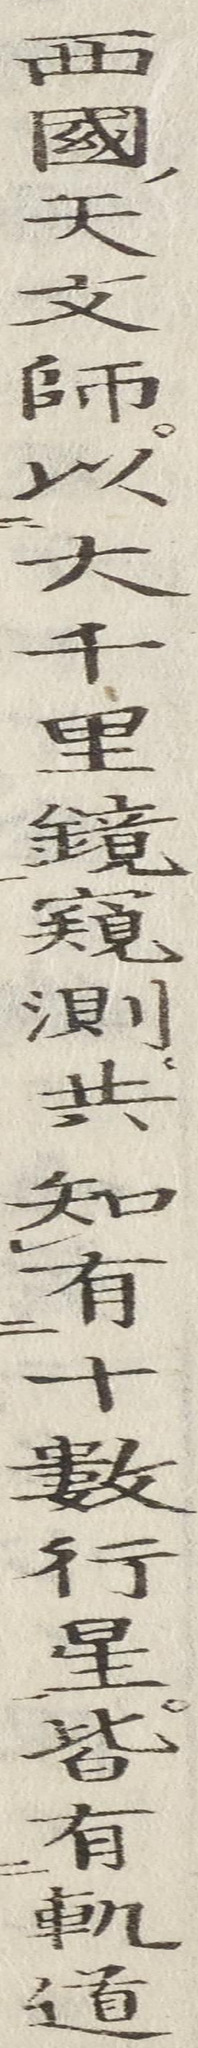西国天文師。以ニ大千里鏡窺測。共知有ニ十数行星。皆有ニ軌道
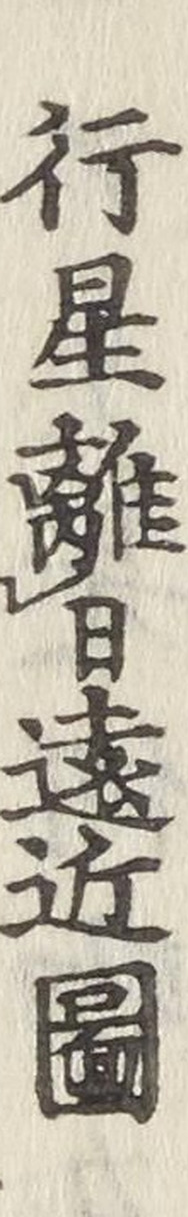同行星離日遠近図
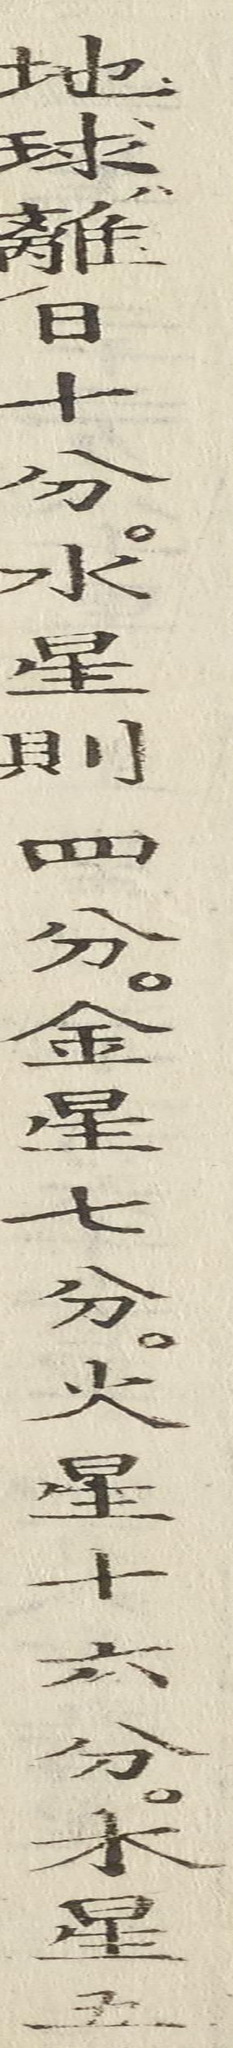地球。離日十分。水星則四分。金星七分。火星十六分。木星五
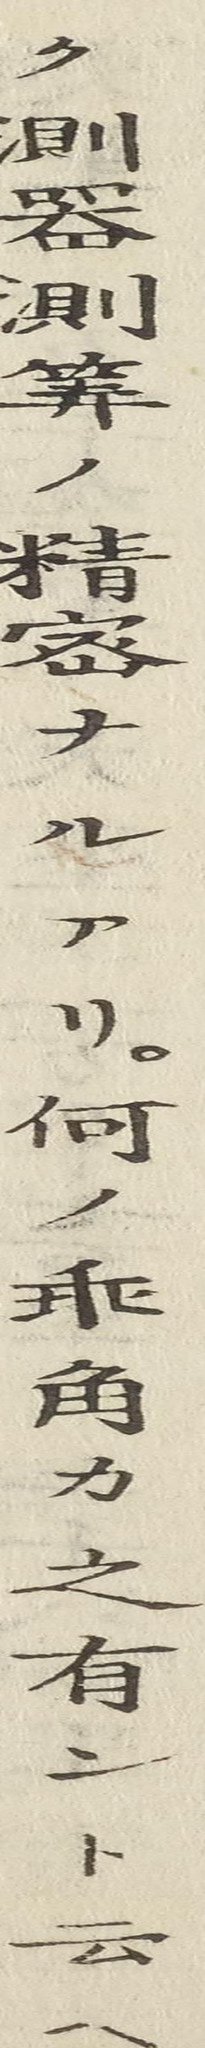ク測器測筭ノ精密ナルアリ。何ノ乖角カ之有ント云ヘ
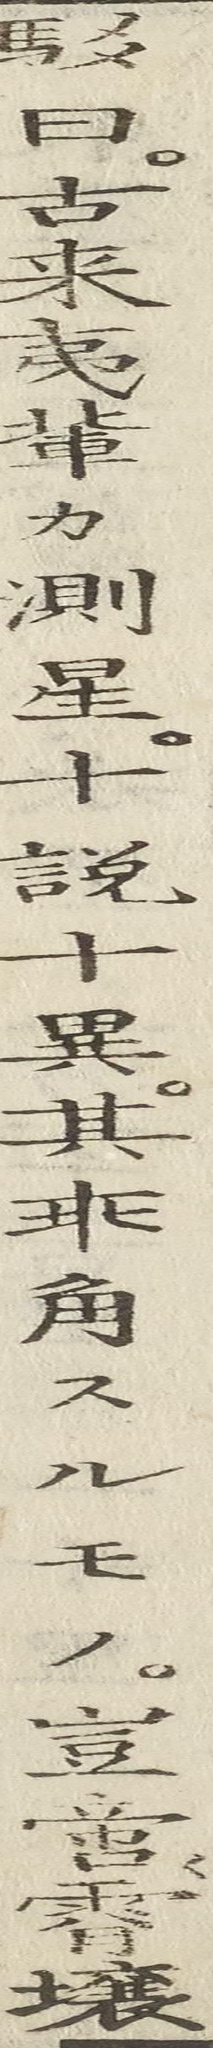駁曰。古来夷輩カ測星。十説十異。其乖角スルモノ。豈啻〱霄壌
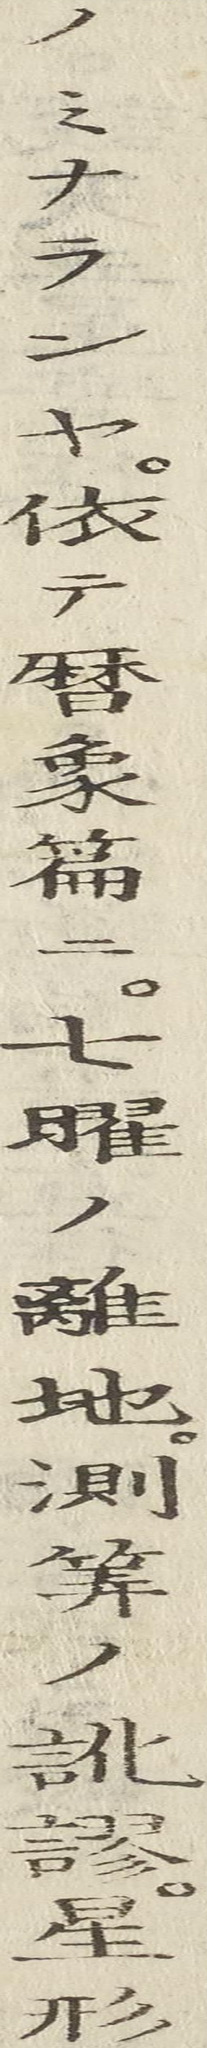ノミナランヤ。依テ暦象篇ニ。七曜ノ離地。測筭ノ訛謬。星形
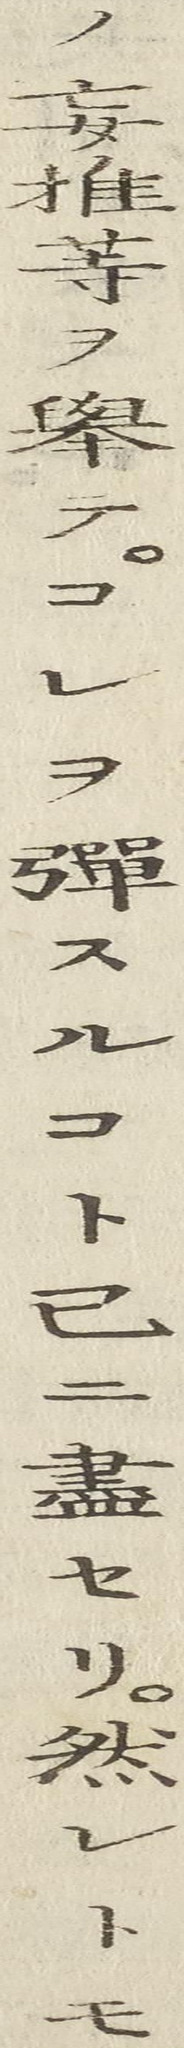ノ妄推等ヲ挙テ。コレヲ弾スルコト已ニ尽セリ。然レトモ
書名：護法新論　二編　下
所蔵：東京大学地震研究所図書室 Earthquake Research Institute Library, The University of Tokyo, JAPAN
